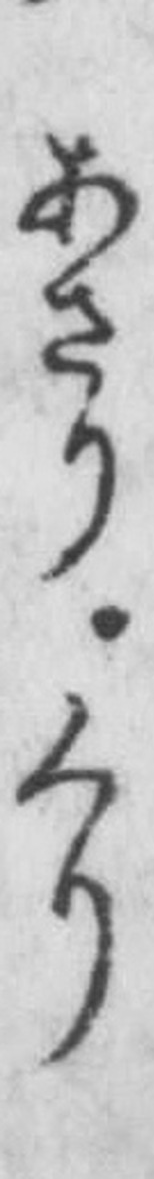あさりくり
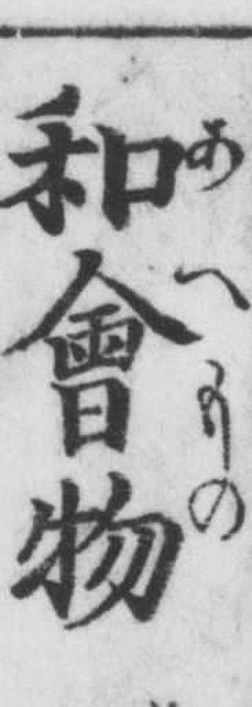和會物
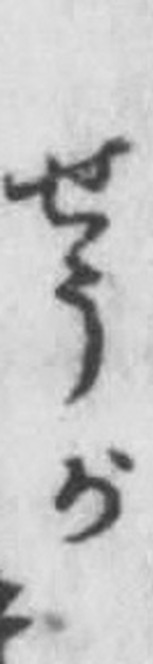せうが
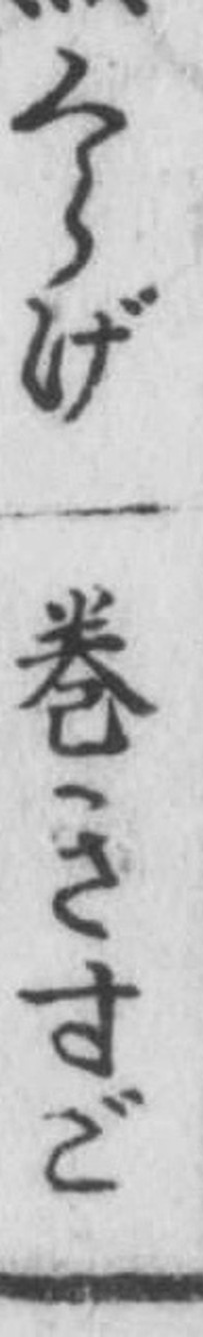黒くらげ巻きすご
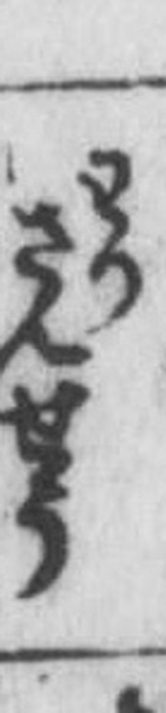さんせう
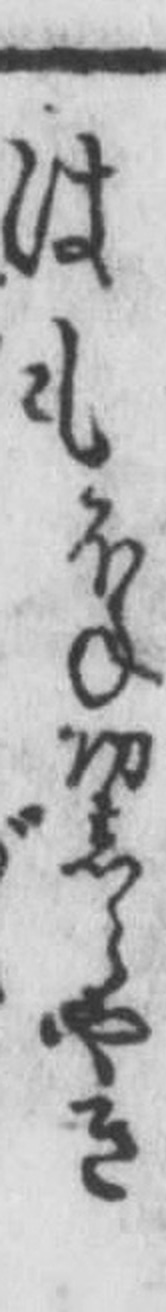はもほね切しらやき
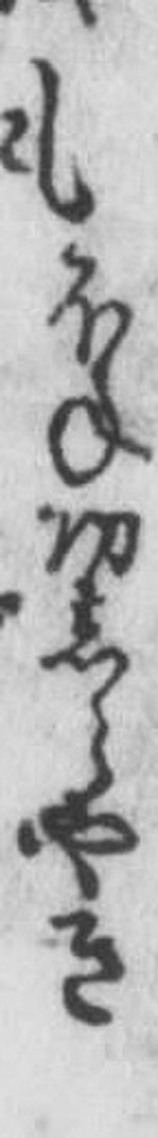はもほね切しらやき
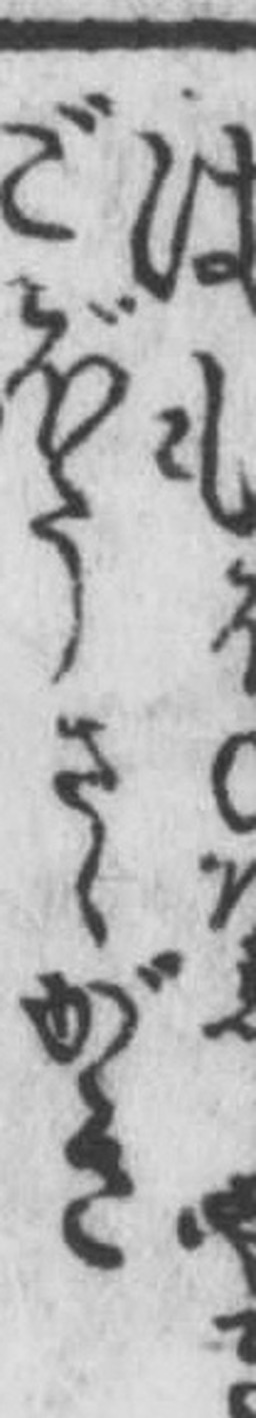ごぼうさゝがき
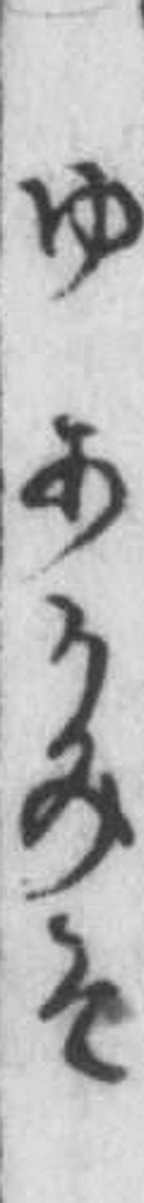ゆあかみそ
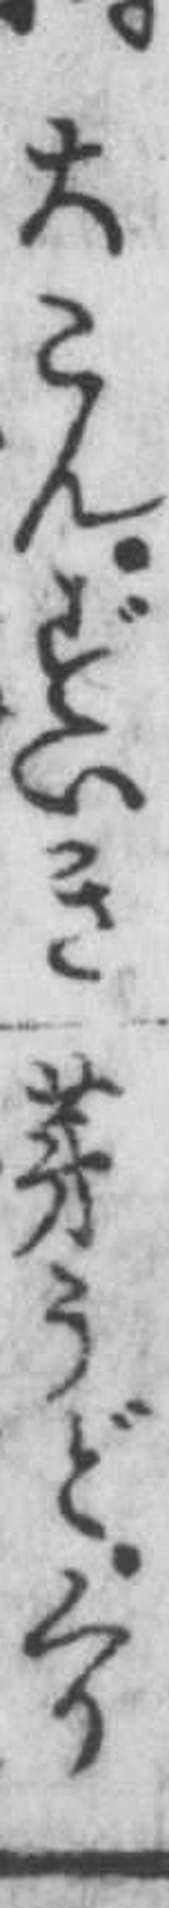大こんずいき芽うどくり

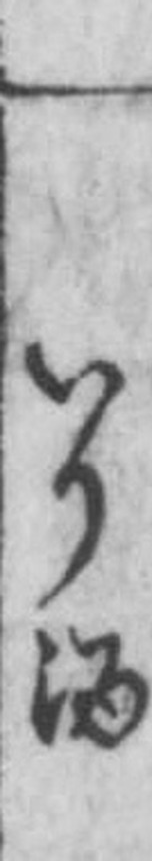いり酒
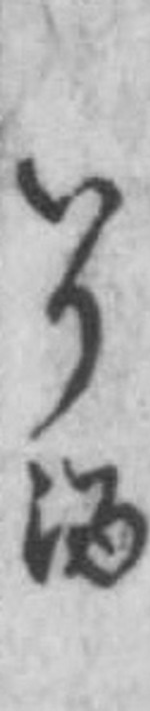いり酒
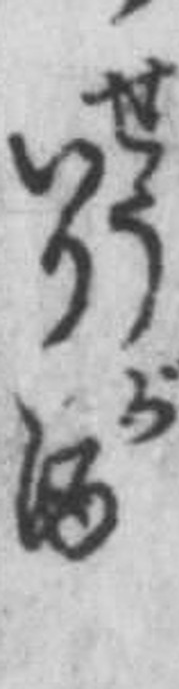いり酒
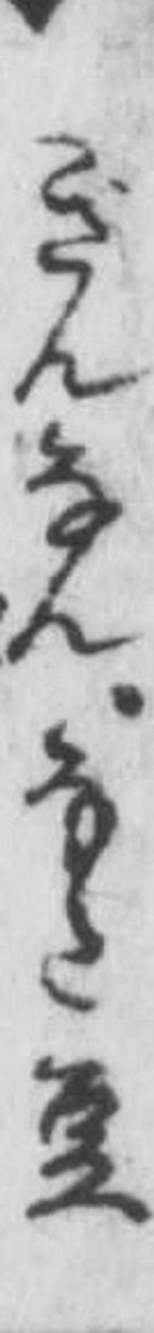ぎんなんなた豆
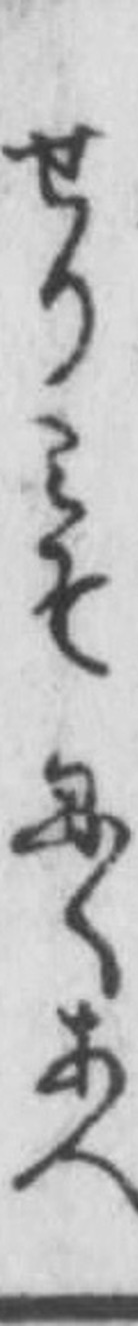せりミそあくあへ
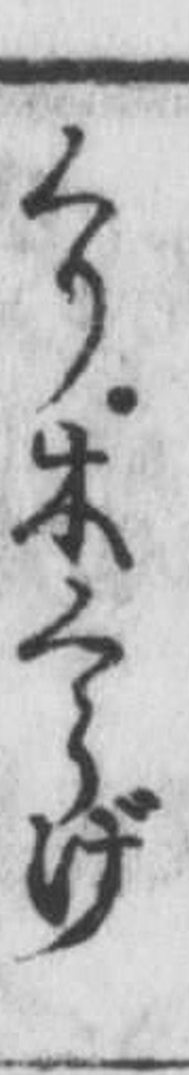くり木くらげ
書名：当世料理筌
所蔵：大阪府立大学学術情報センター 国文学研究資料館
